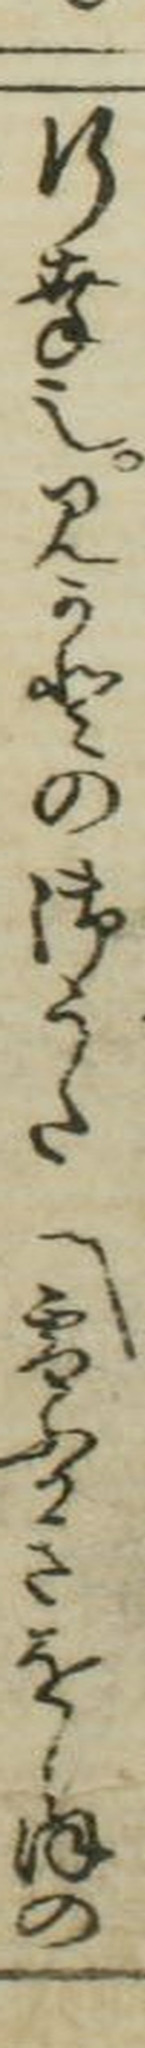行幸也。みかとの御うた〽雪ふかきをしほの
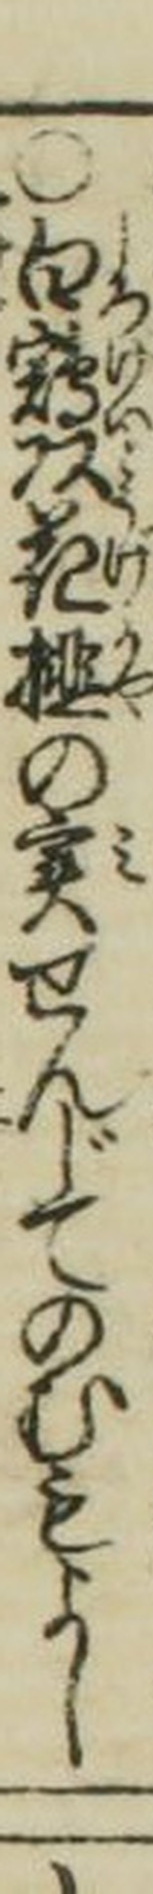◯白鶏頭花の実せんじてのむもよし
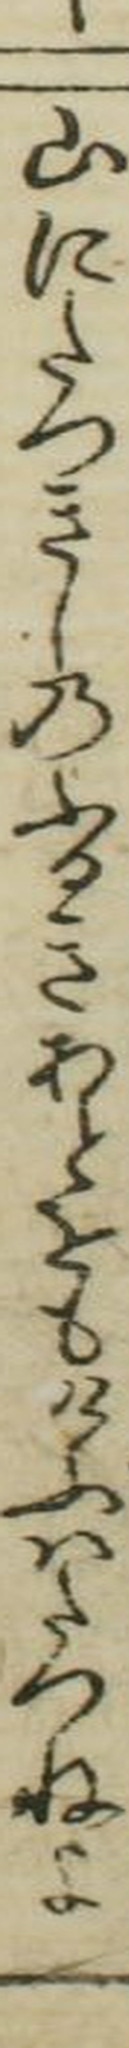山にたつきしのふるきあとをもけふはたつねよ
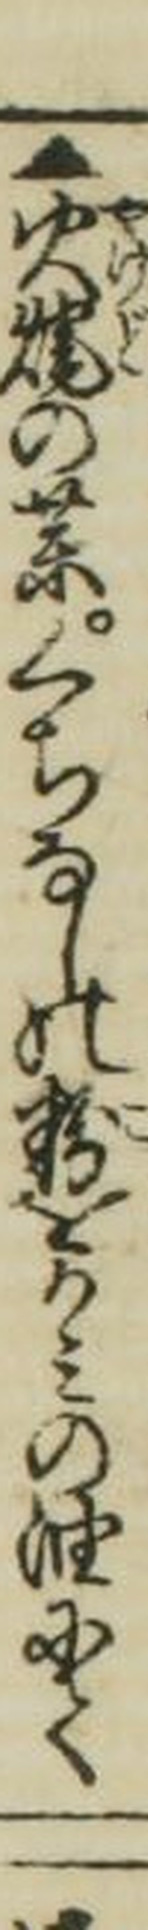▲火焼の薬。くちなしの粉をかみの油にて
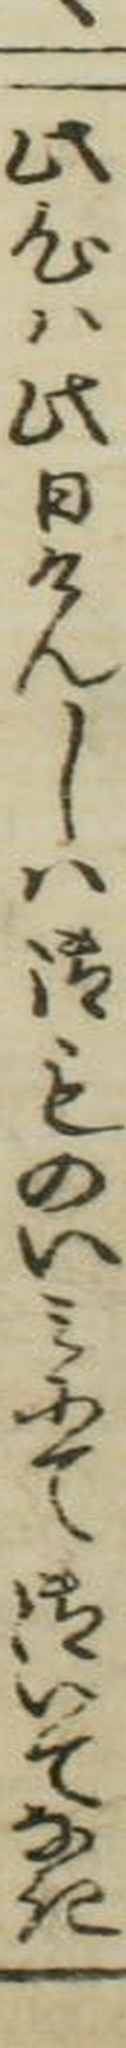此心は此日けんしは御ものいみにて御いてなき
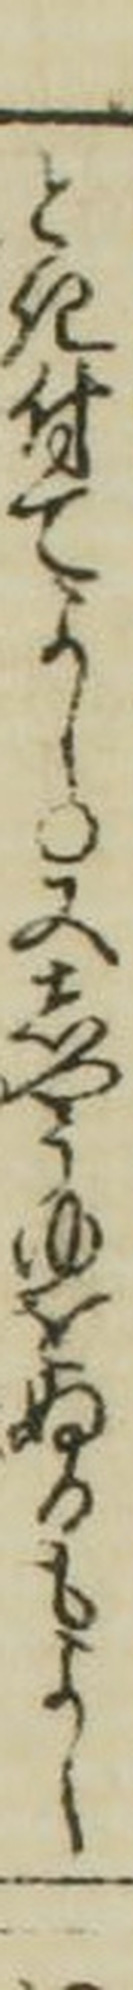とき付てよし◯又しやうゆをぬるもよし
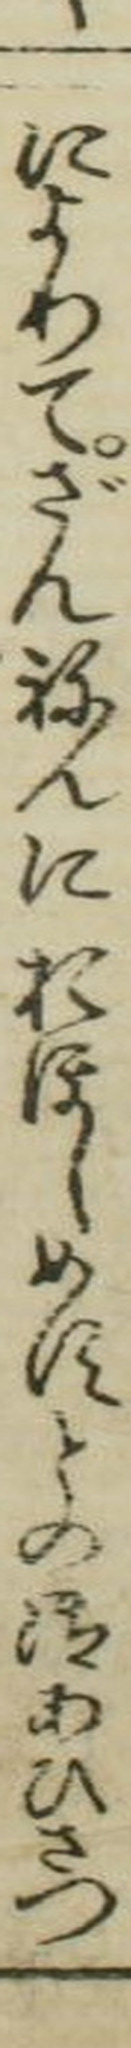によりて。ざんねんにおほしめすとの御あひさつ
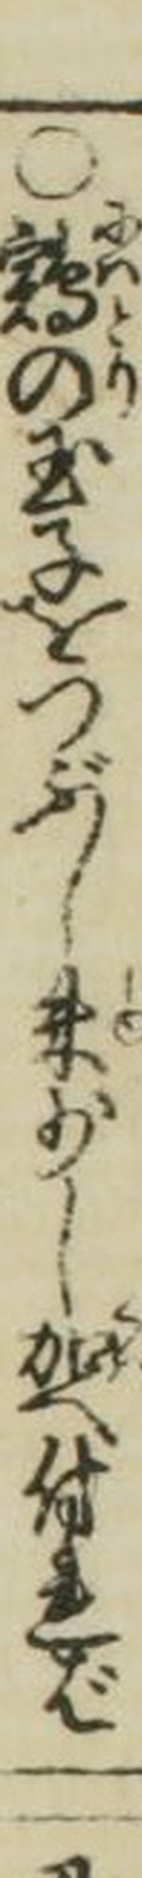◯鶏の玉子をつぶし朱少し加へ付れば
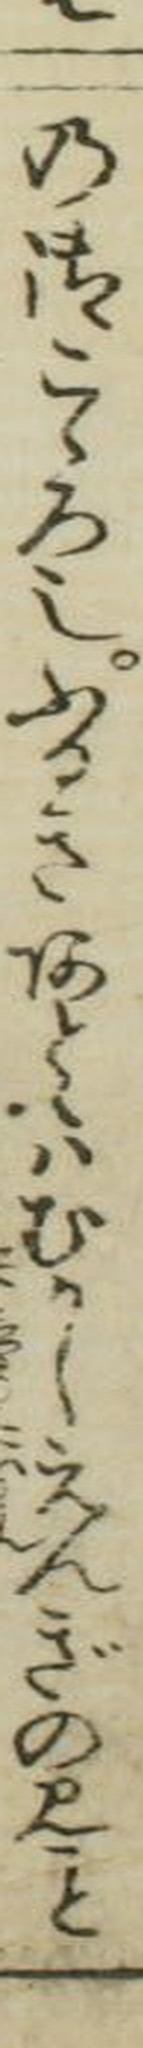の御こゝろ也。ふるきあとゝはむかしえんぎのみこと
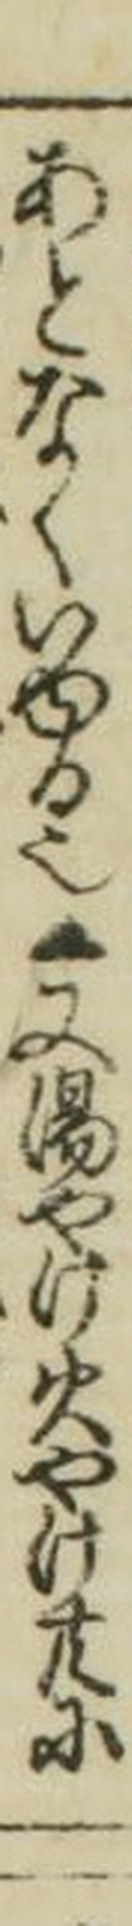あとなくいゆる也▲又湯やけ火やけ共に
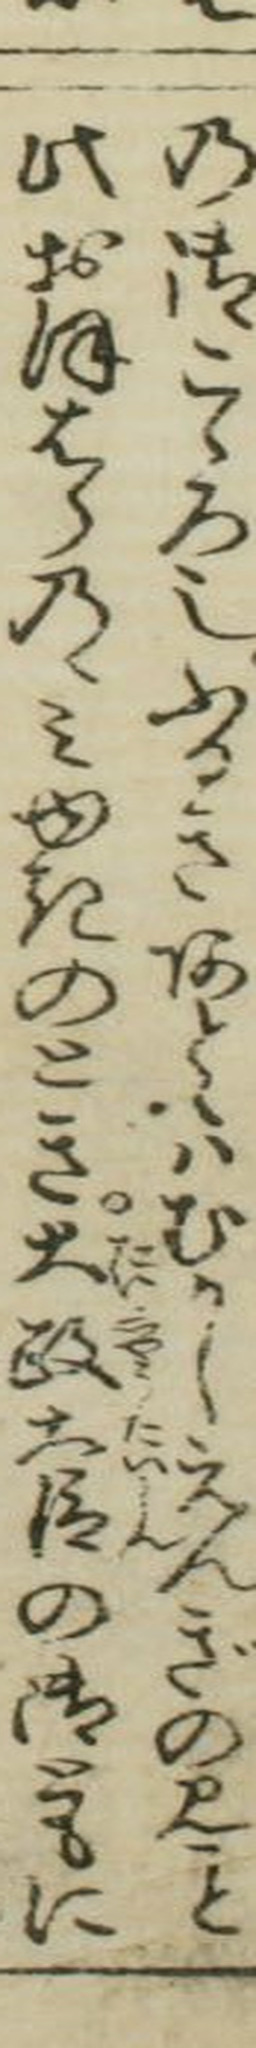此おほはらのゝみゆきのとき。大政大臣の御ともに
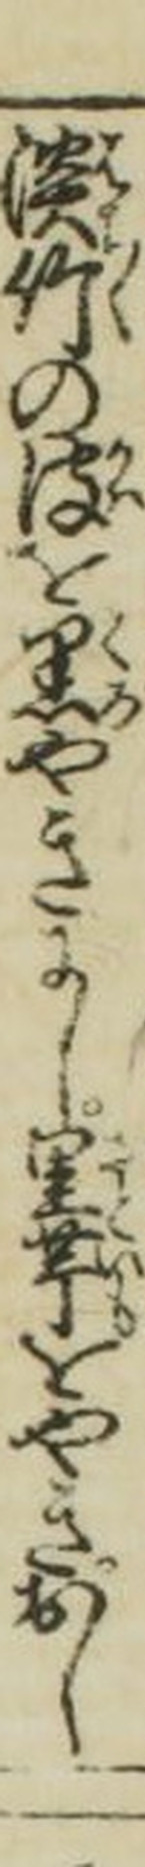淡竹の皮を黒やきにし。里芋をやき。おし
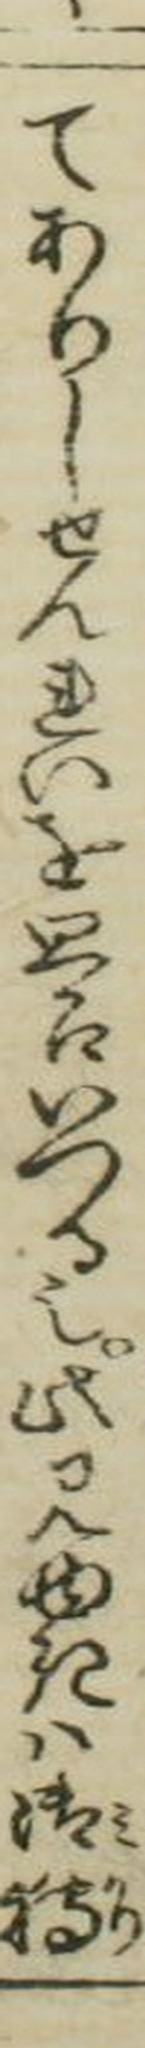てありしせんれいを思召いつる也。此みゆきは御狩
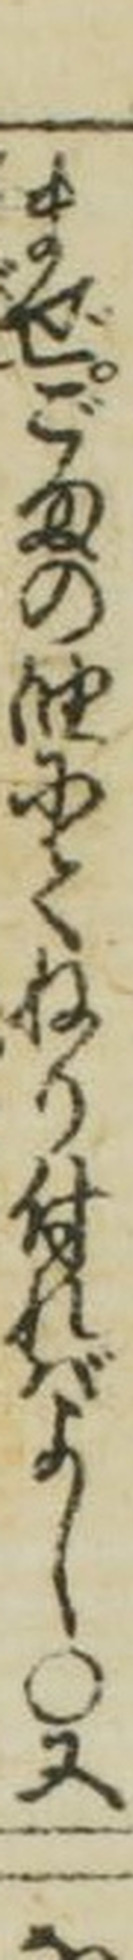まぜ。ごまの油にてねり付ればよし◯又
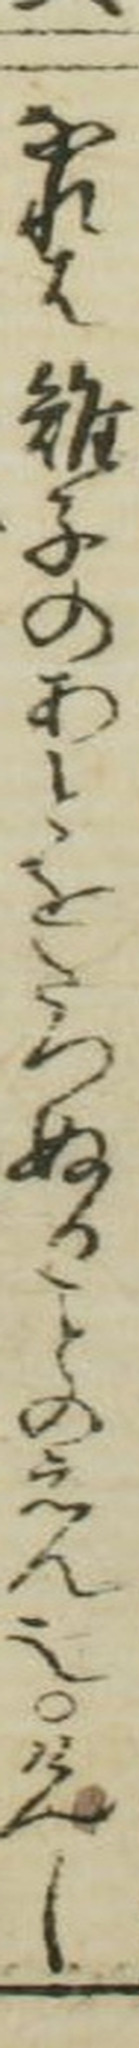なれは雉子のあとをたつぬることのえん也。けんし
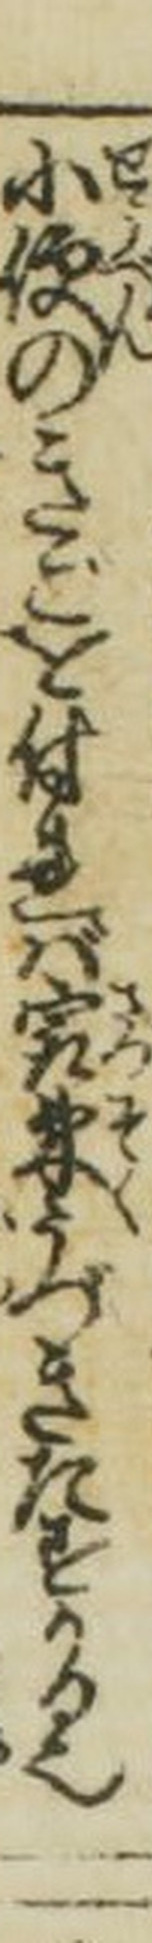小便のきごを付れば最束うづきたすかる也
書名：女源氏教訓鑑
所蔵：東京学芸大学附属図書館
